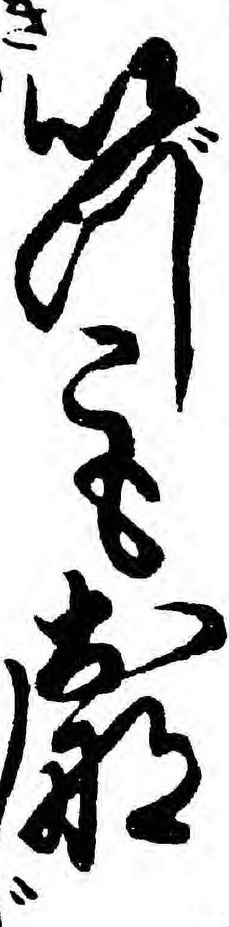いづこもおなじ
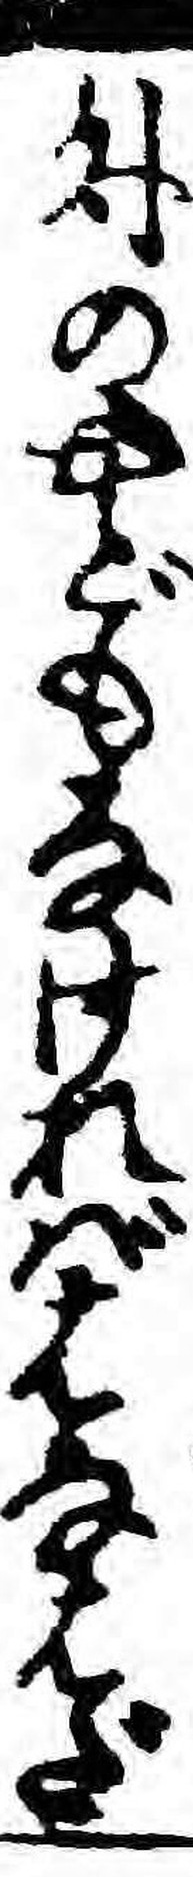外のやどもなければはなはだ
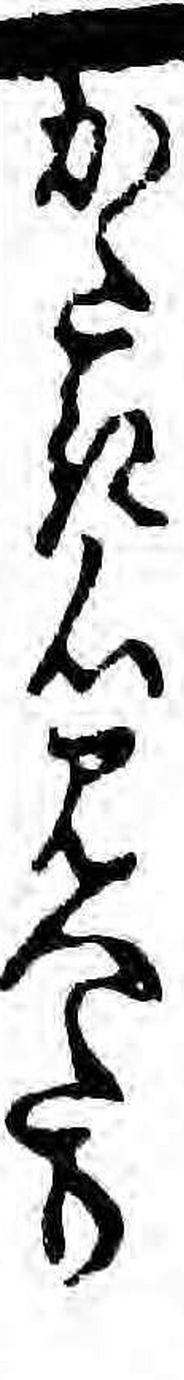かたき心見へたり
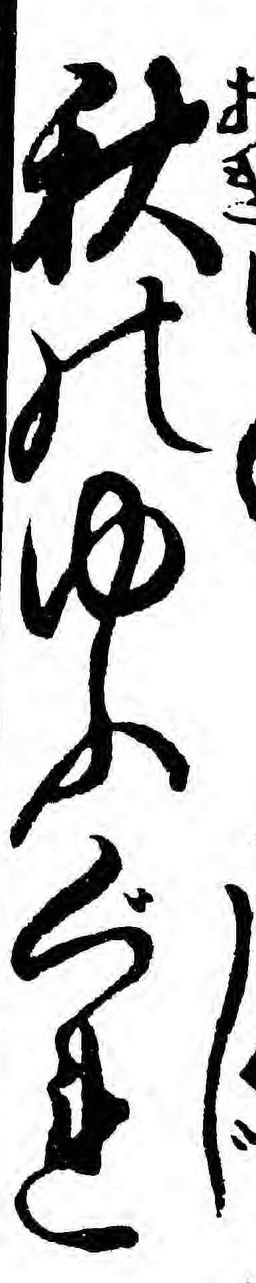秋のゆふぐれ
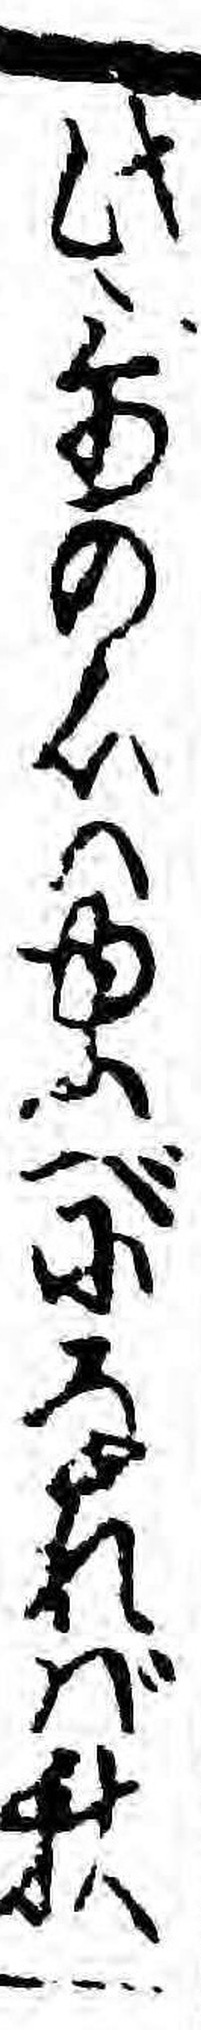此哥の心はゆふべになれば秋
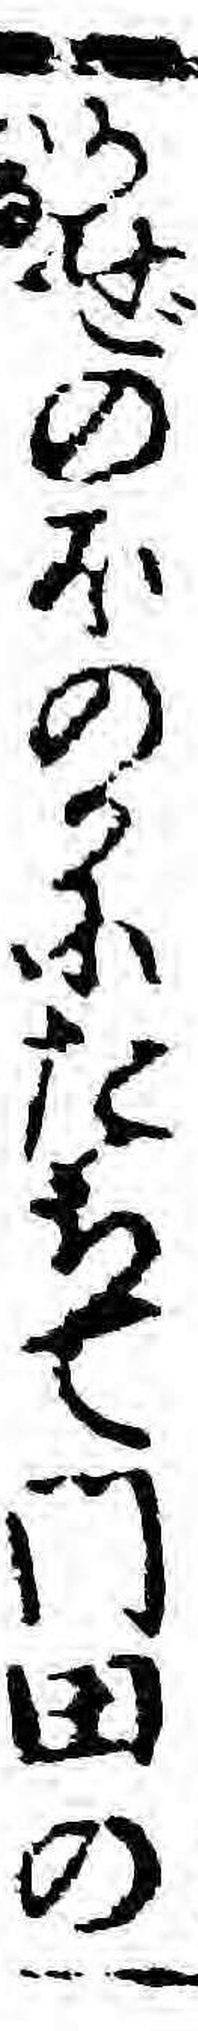かぜのほのかにたちて門田の
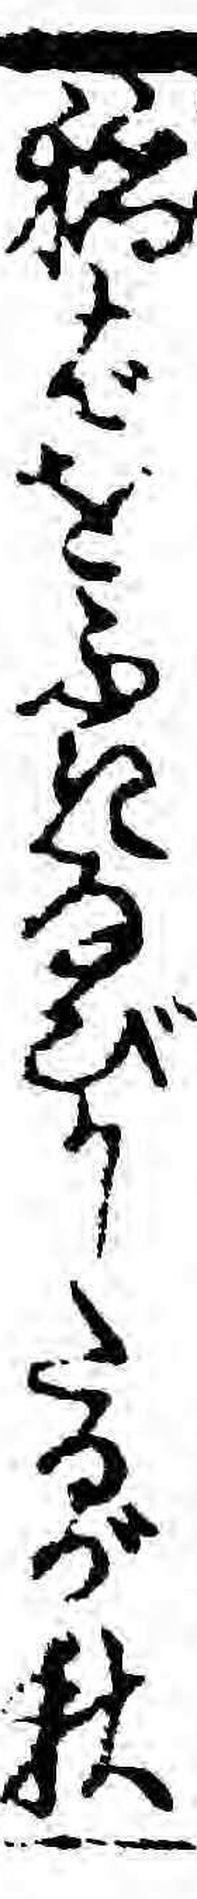稲ばをふきなびかしたるが秋
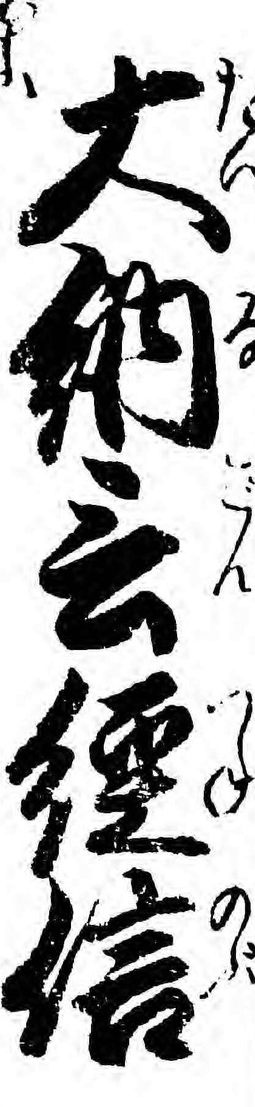大納言経信
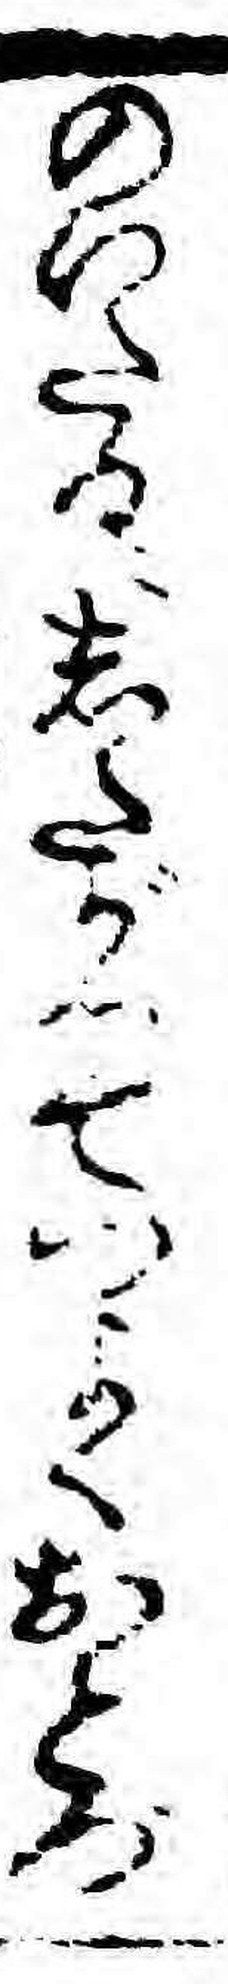のいたるにしたがつてつよくおとづ
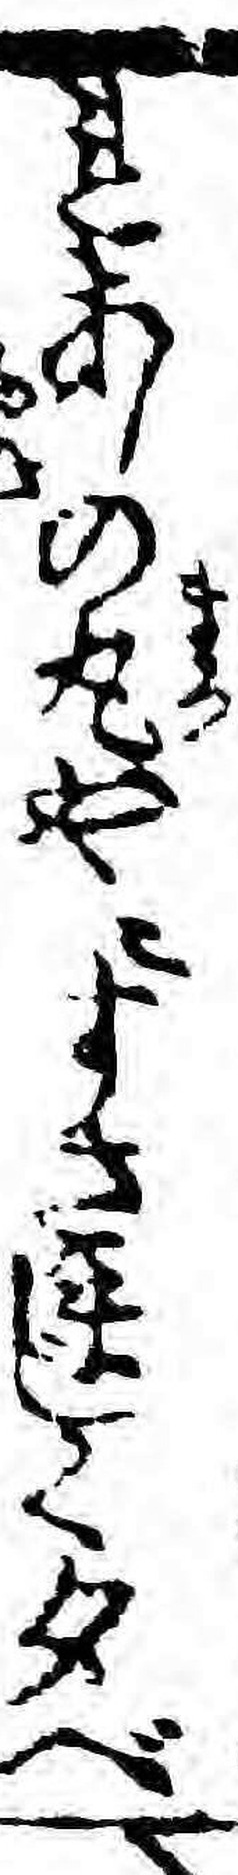れあしの丸やにすさまじく夕べ
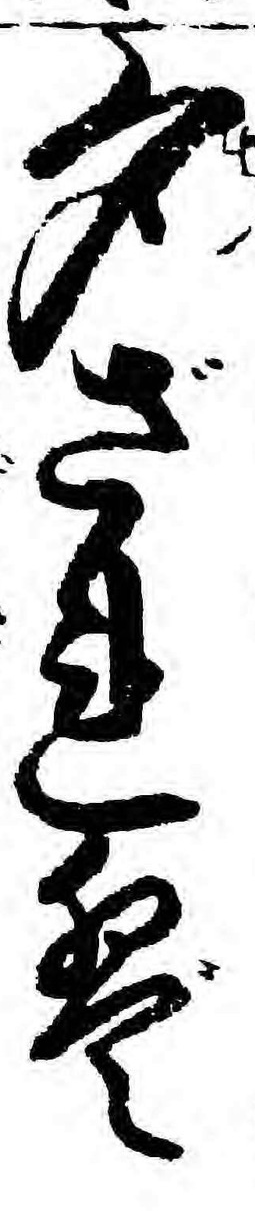夕ざれば
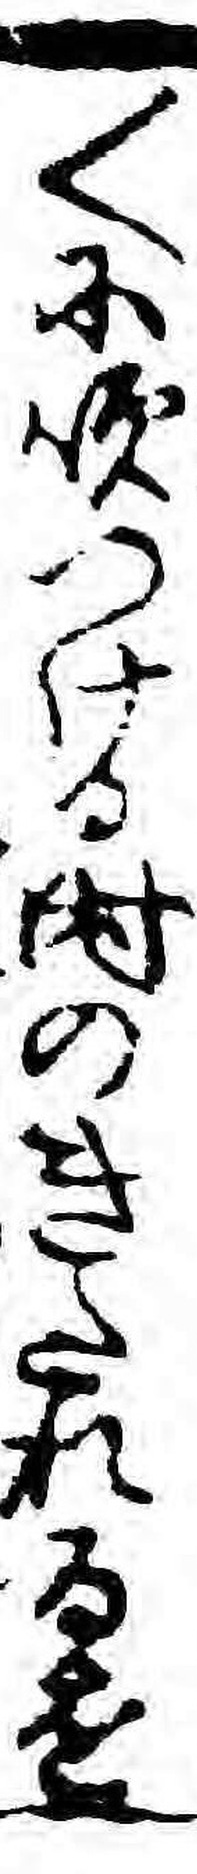〳〵に吹つける時のきたれるを
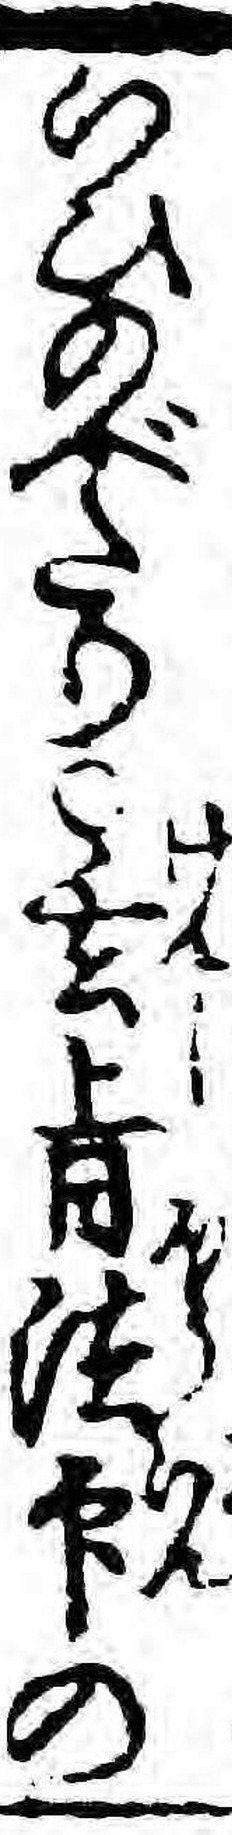いひのべたり〇玄旨法印の
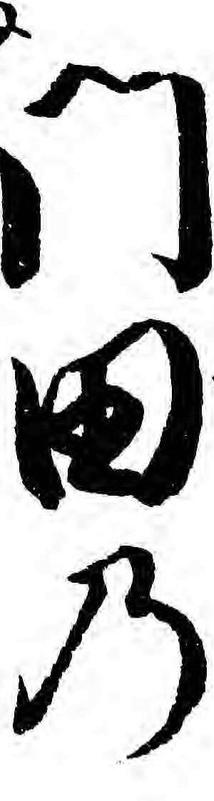門田の
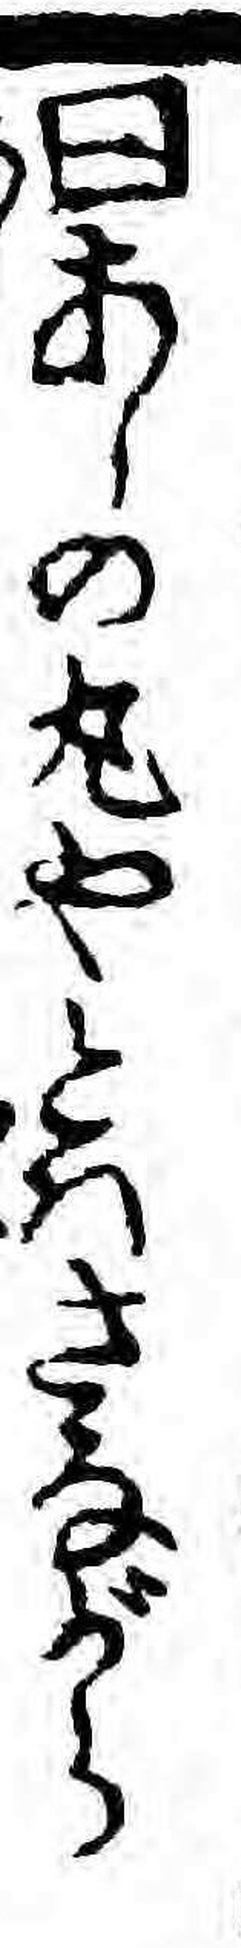曰あしの丸やとはさながら
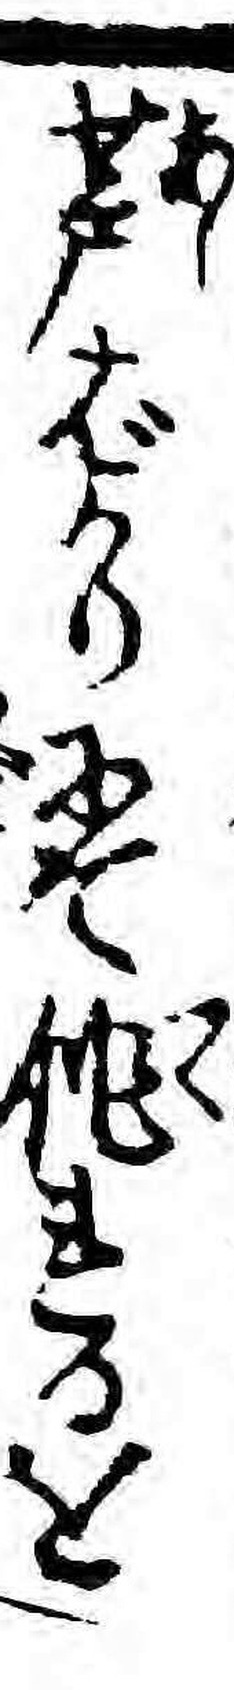芦ばかりにて作れるを
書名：頭書和歌注譯／壽賀多百人一首小倉錦
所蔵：国文学研究資料館
